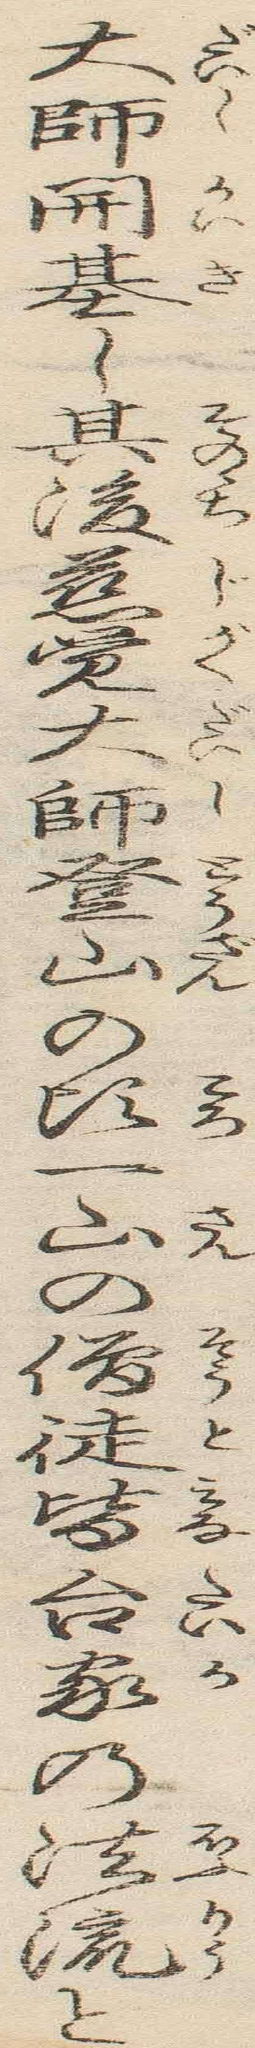大師開基し其後慈覚大師登山の頃一山の僧徒皆台家の法流と
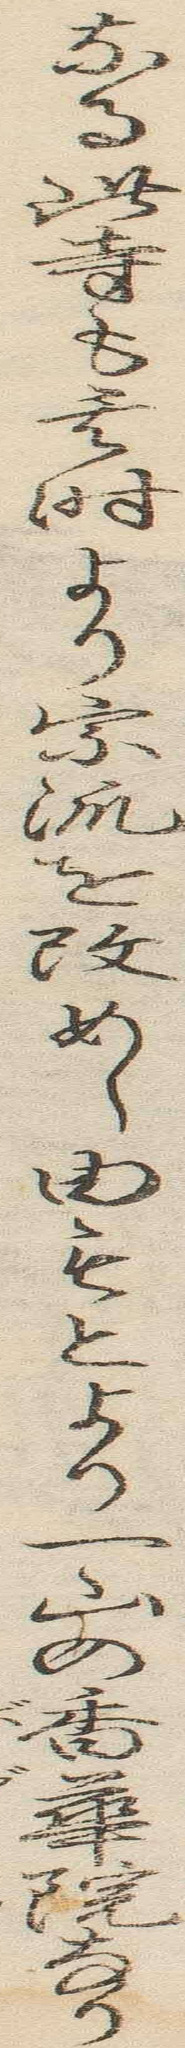なる此寺も其时より宗派を改めし由もとより一山の香蕐院なり
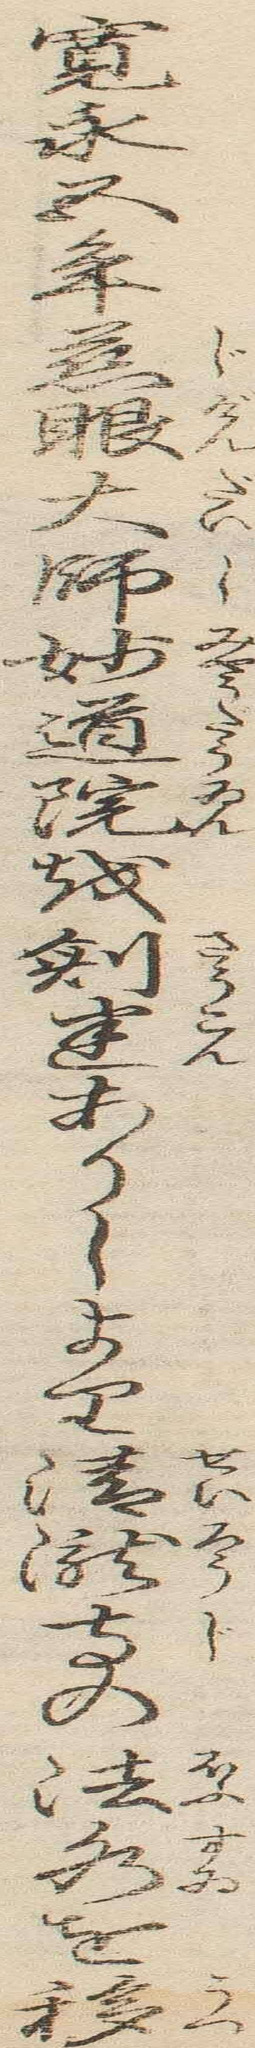寛永五年慈眼大師妙道院を創建ありしより清瀧寺の法水を移
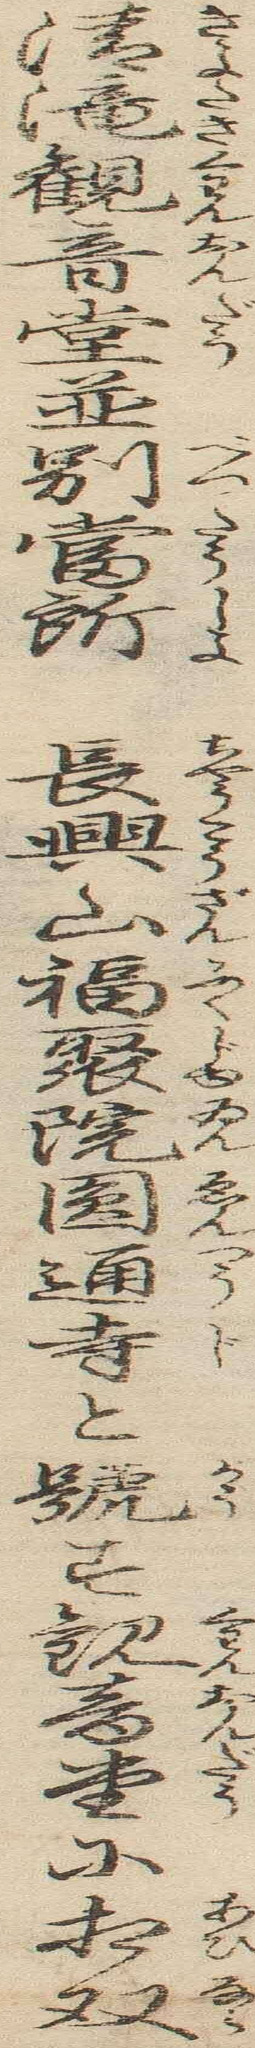清滝観音堂並別當所長興山福聚院圓通寺と號す観音堂に相双

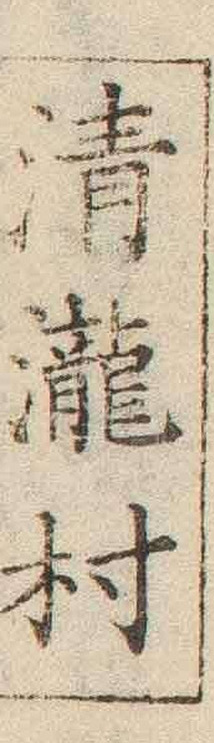清瀧村
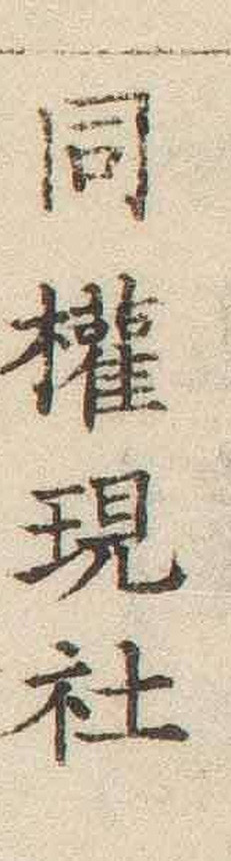同權現社

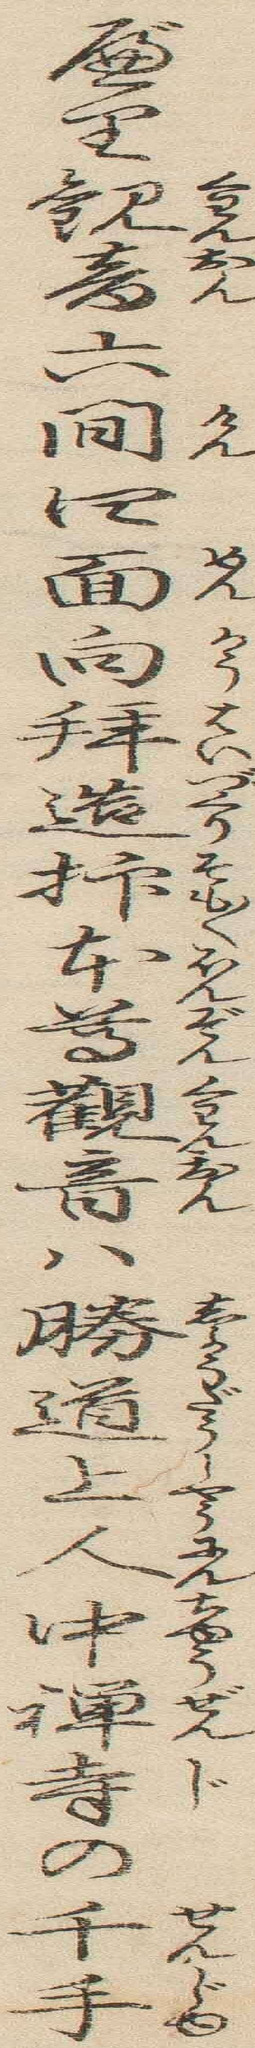べり観音六間四面向拜造抑本尊觀音は勝道上人中禅寺の千手
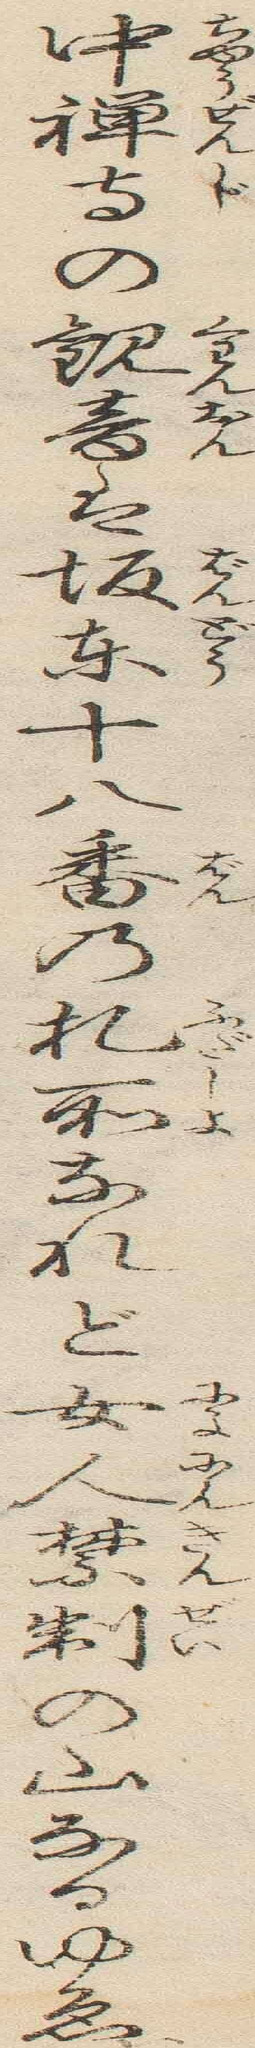中禅寺の観音は坂東十八番の札所なれど女人禁制の山なるゆゑ
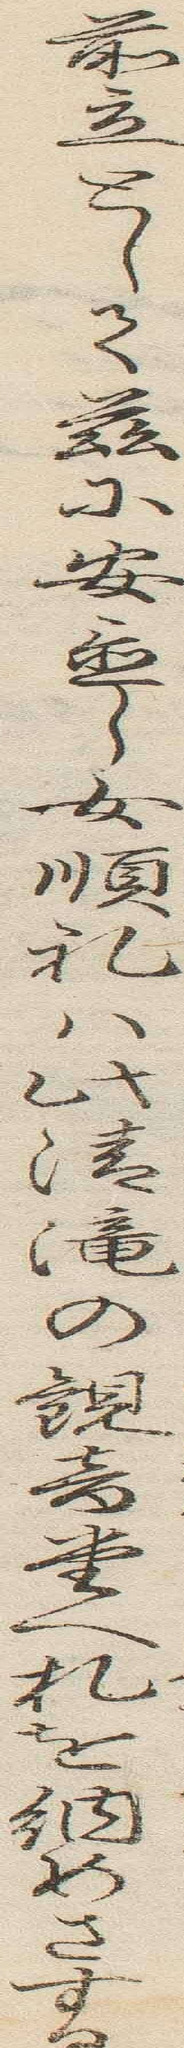前立として兹に安置し女順礼は此清滝の観音堂へ札を納めさする
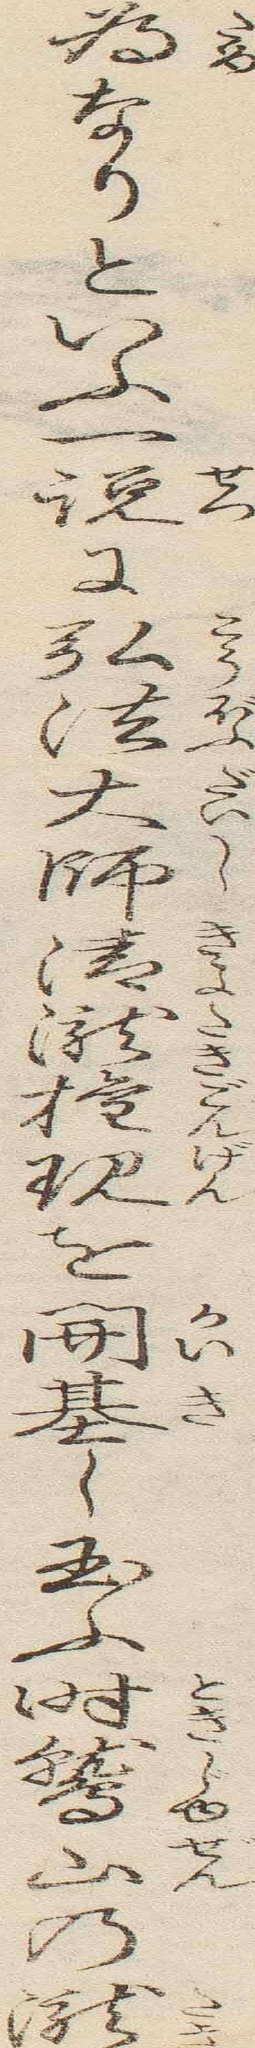為なりといふ一説に弘法大師清瀧権現を開基し玉ふ时鷲山の瀧
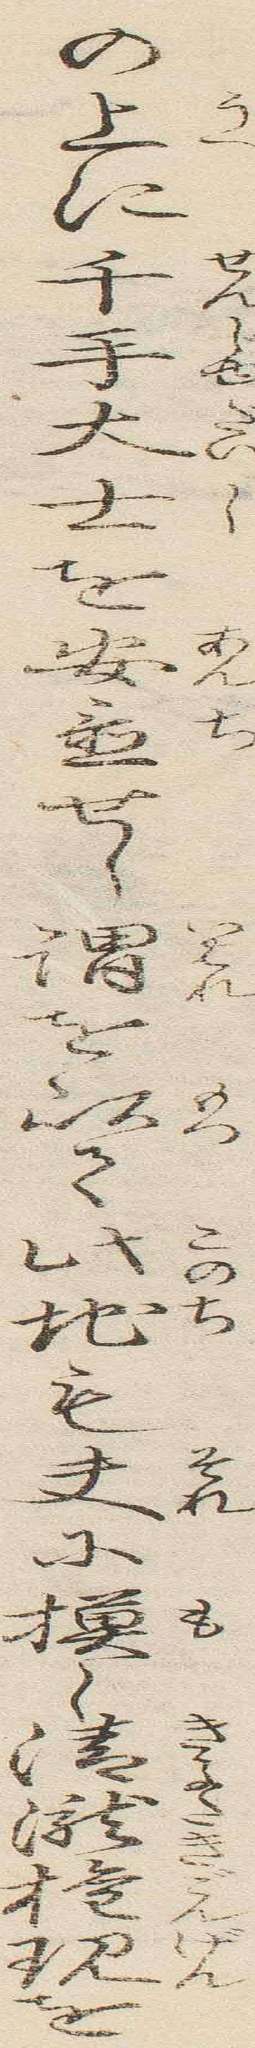の上に千手大士を安置せし謂を以て此地も夫に摸し清瀧権現を
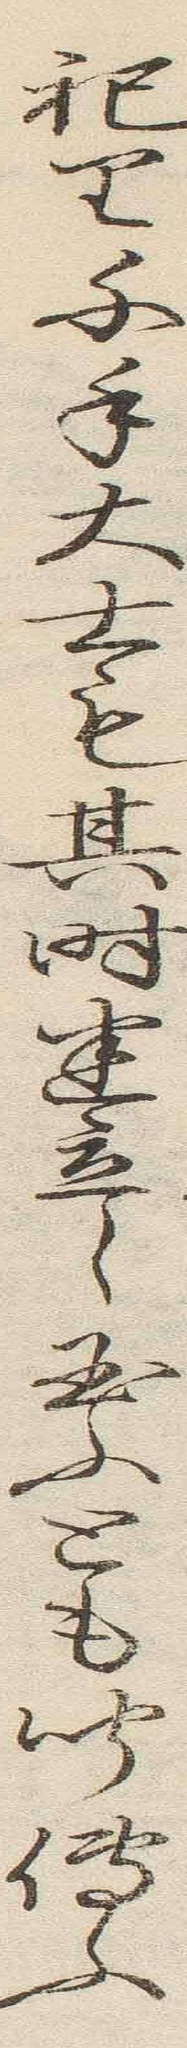祀り千手大士も其时建立し玉ふとも聞傳ふ
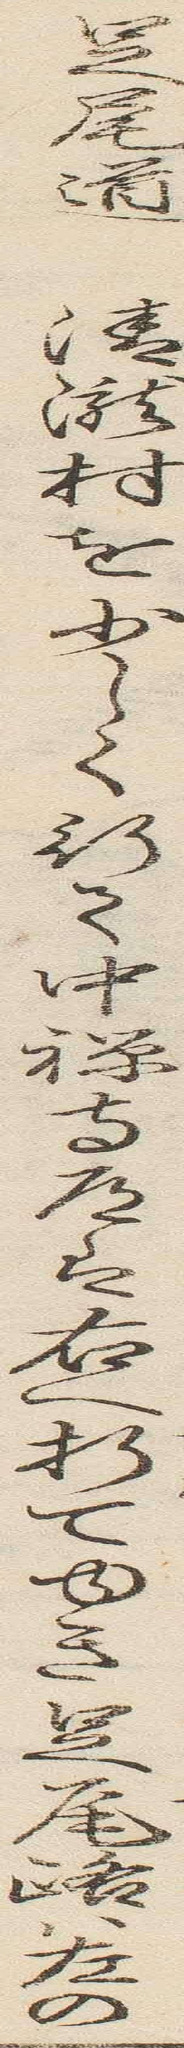足尾道清瀧村を少しく行て中禅寺道は右へ折てゆき足尾路は左の
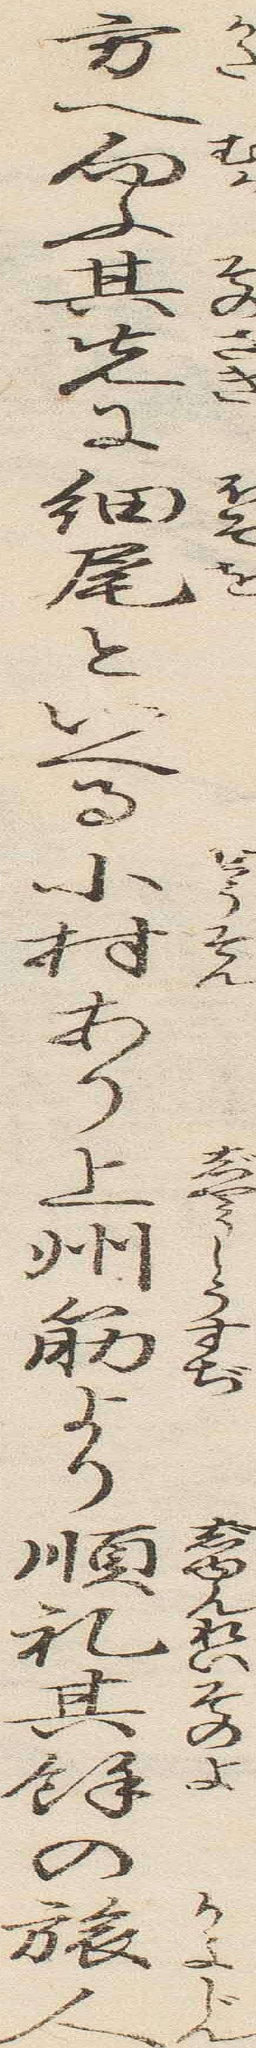方へ向ふ其先に細尾といへる小村あり上州筋より順礼其餘の旅人
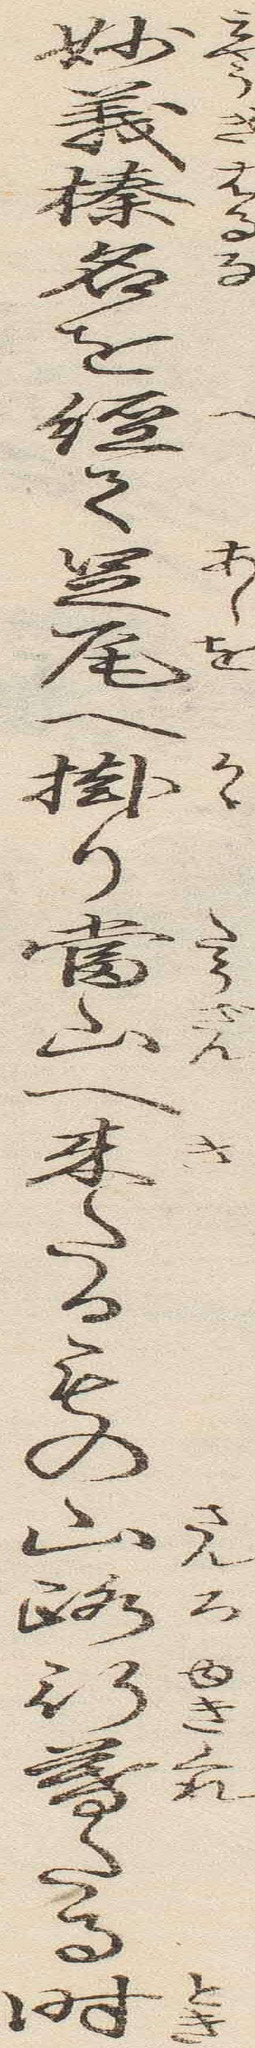妙義榛名を經て足尾へ掛り當山へ來たるもの山路行暮たる时
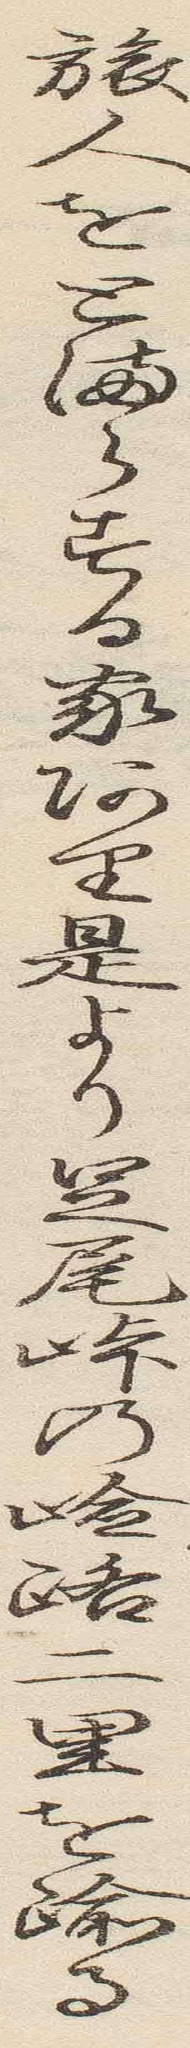旅人をとまらする家あり是より足尾峠の嶮路二里を踰る
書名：日光山志
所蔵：東京学芸大学附属図書館 国文学研究資料館
